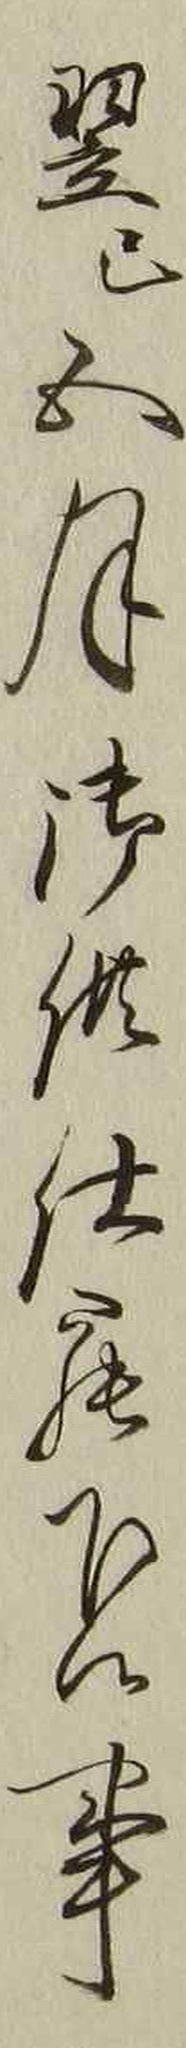欲巳五月御供仕罷下候事
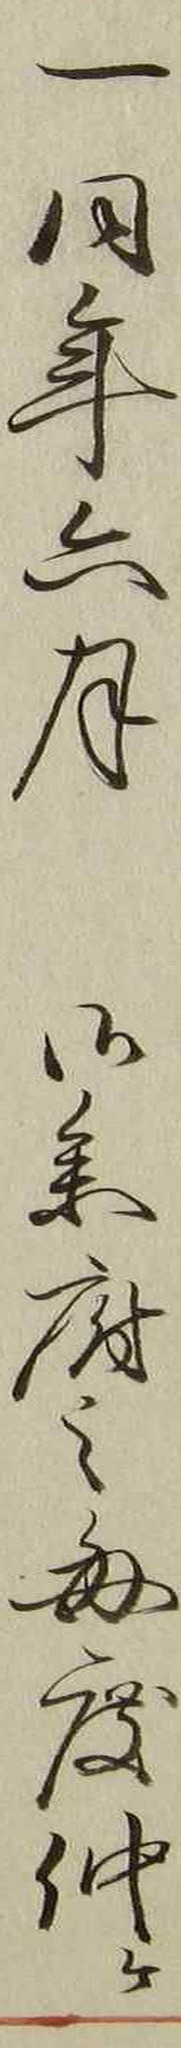一同年六月御参府之毎度仲ヶ
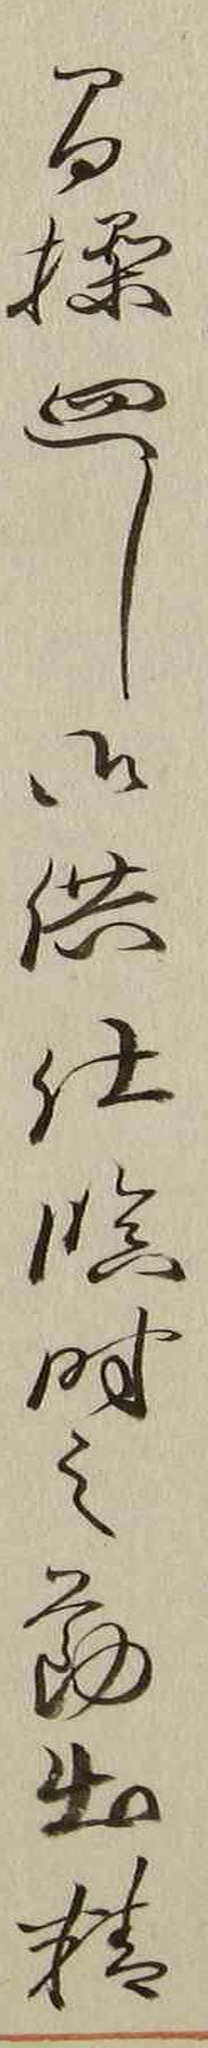間操廻し御供仕臨時之勤出精
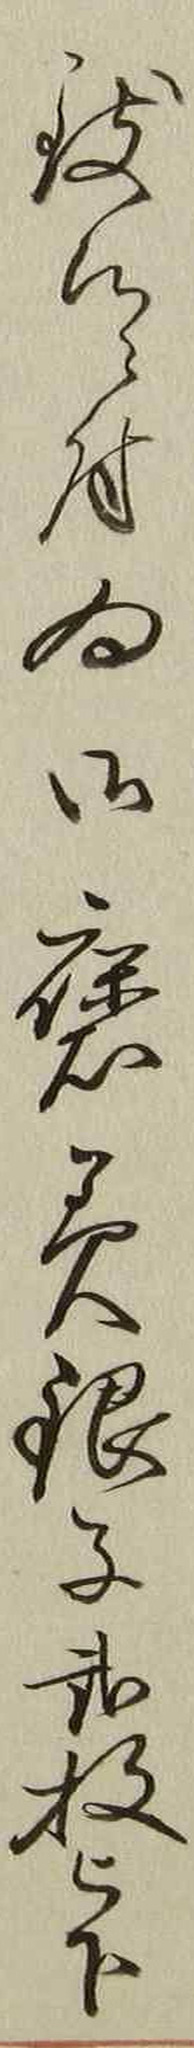致候ニ付為御褒美銀子弐枚被下
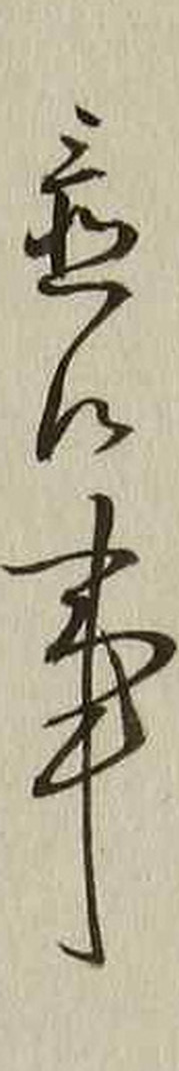置候事
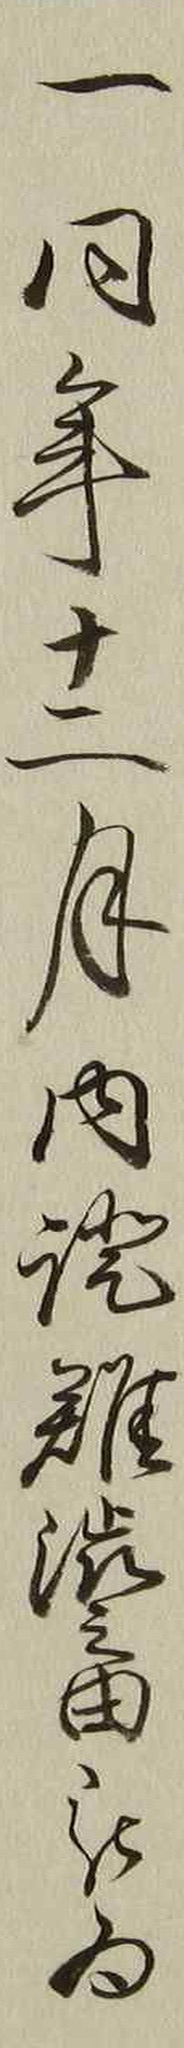一同年十二月内証難渋之由被為
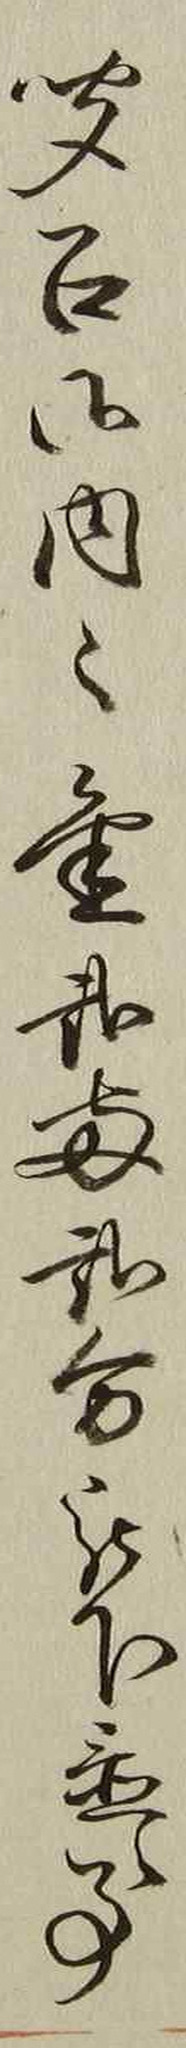聞召御内々金弐両弐分被下置候事
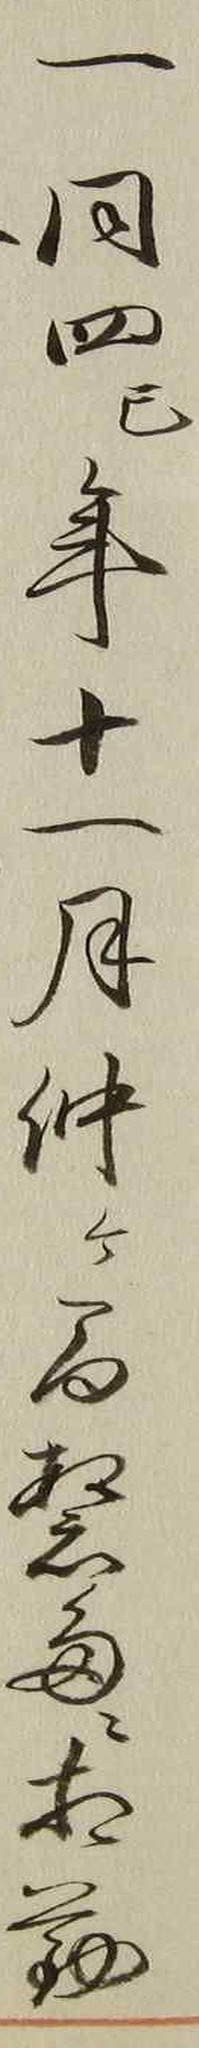一同四巳年十一月仲ヶ間繫多ニ相勤
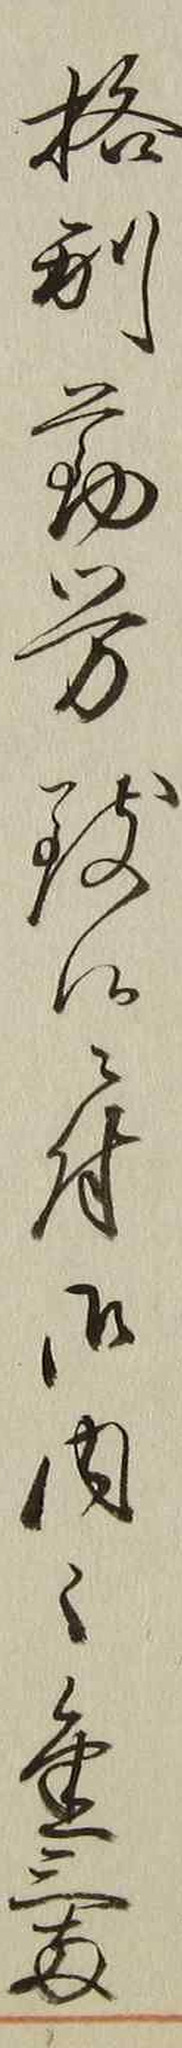格別勤労致候ニ付御内々金三両
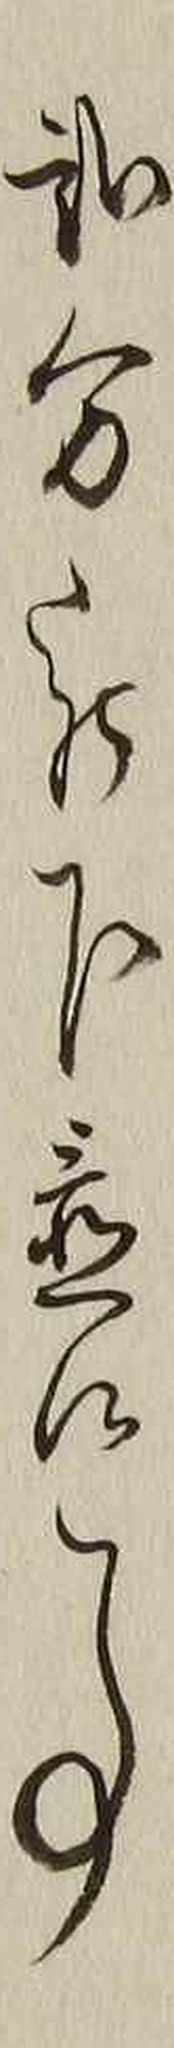弐分被下置候事
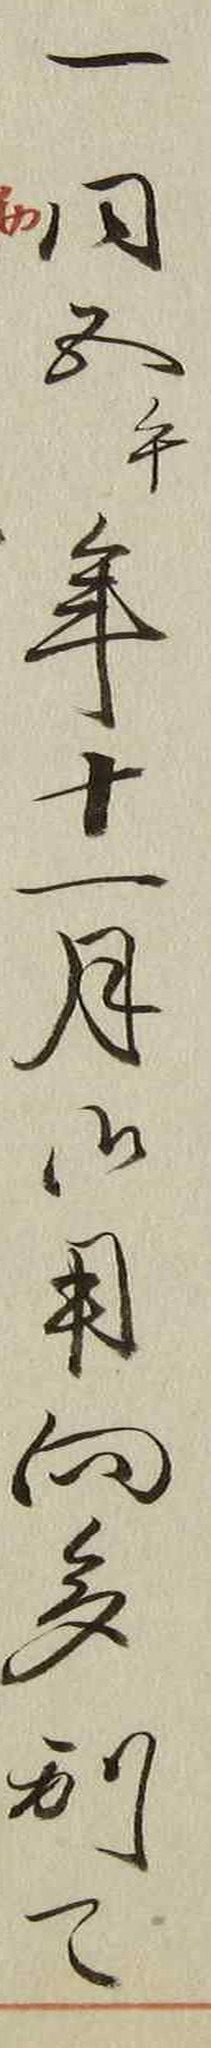一同五午年十一月御用向多別て
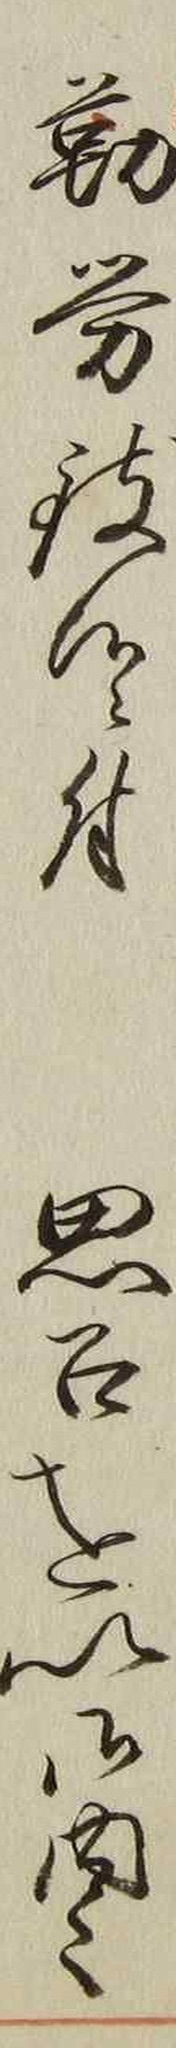勤労致候ニ付思召を以御内々
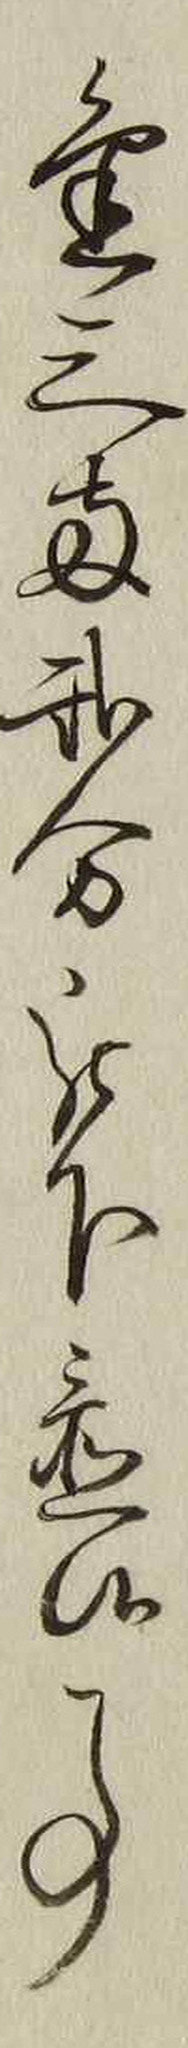金三両弐分被下置候事
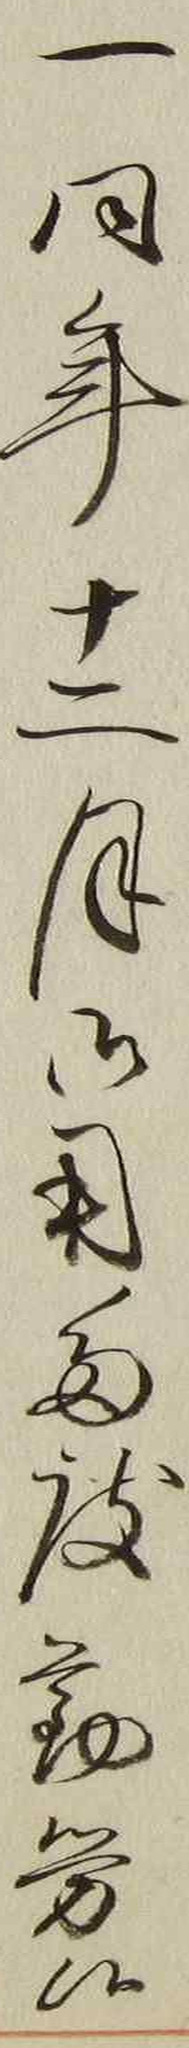一同年十二月御用多致勤労候
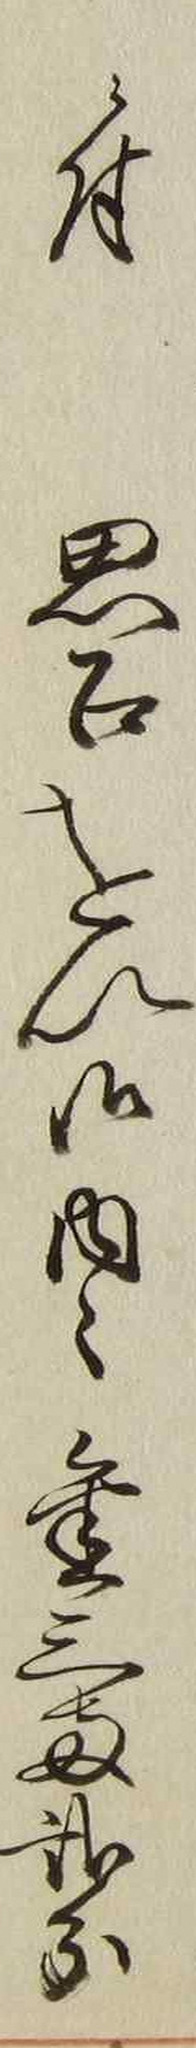ニ付思召を以内々金三両弐分
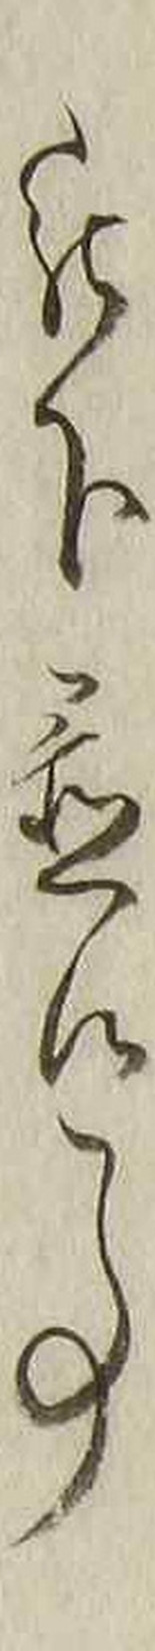被下置候事
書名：諸士系譜　巻之54　ほ之部1
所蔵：会津若松市立会津図書館
